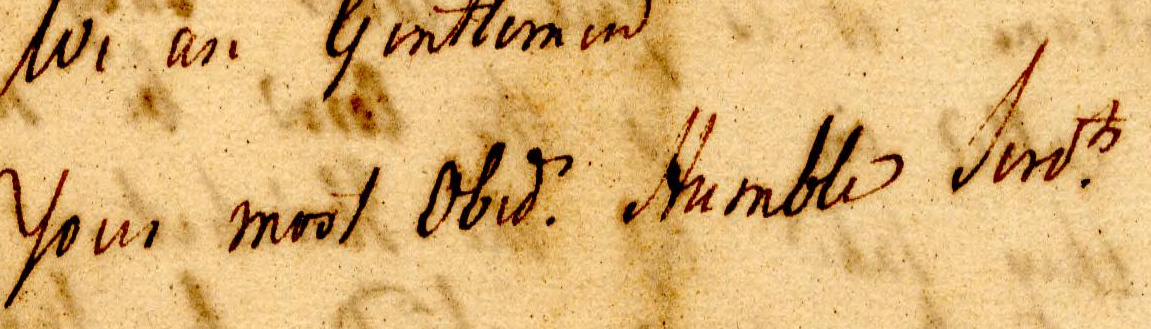Your most Obed^t. Humble Serv^t.
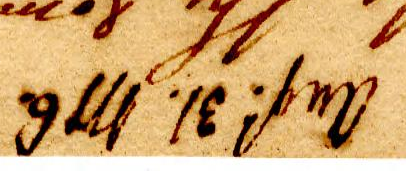Aug^t. 31. 1776.
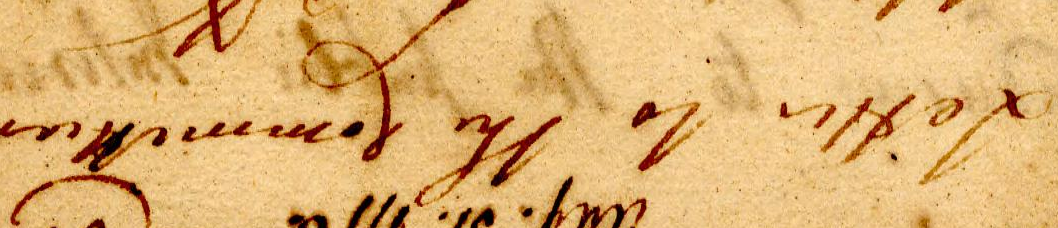Letter to the Committees
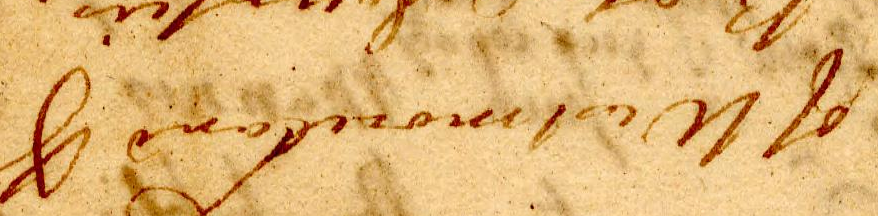of Westmoreland &
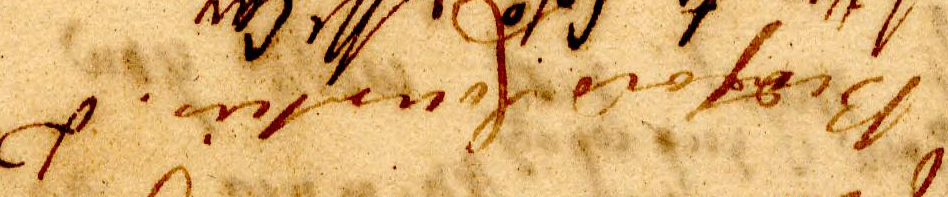Bedford Counties. &
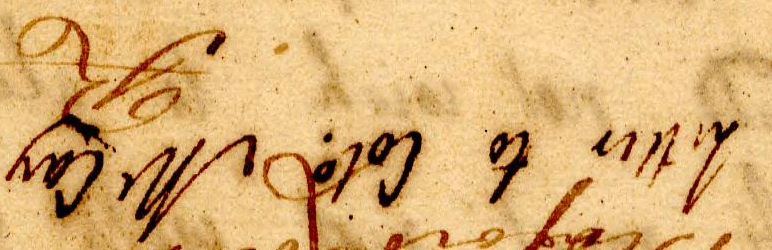Letter to Col^o. M^cCay.
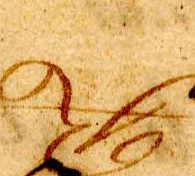R
